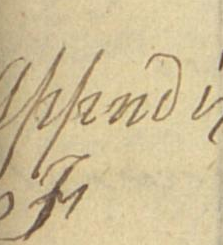Appendix
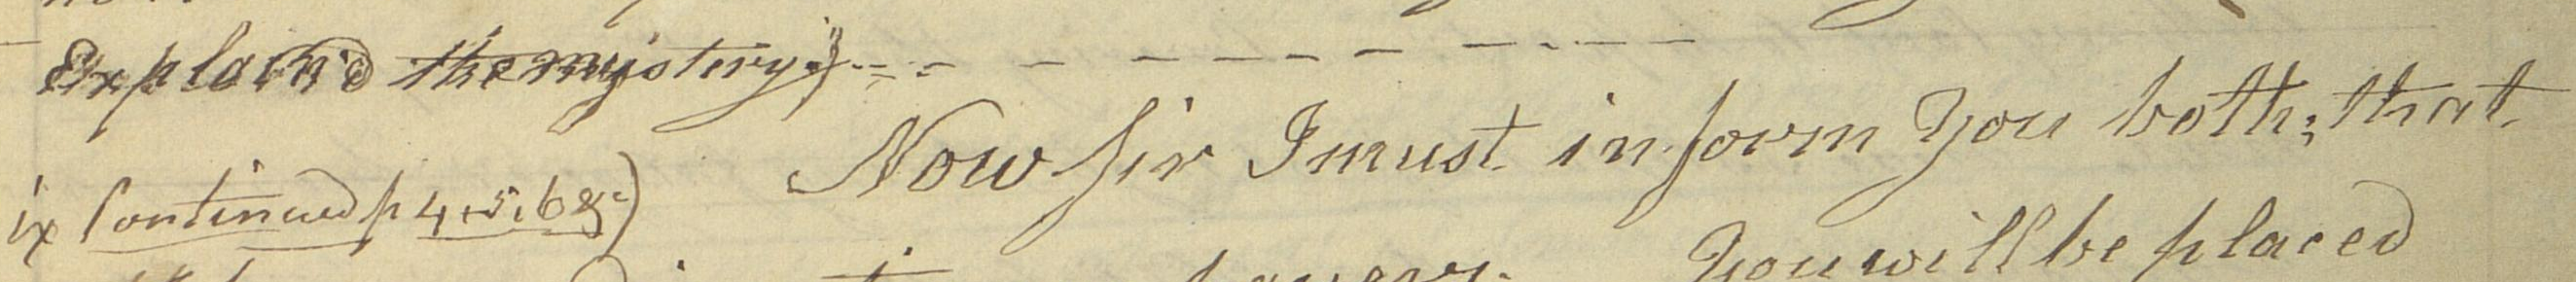Continued privilege) Now Sir I must inform you both; that
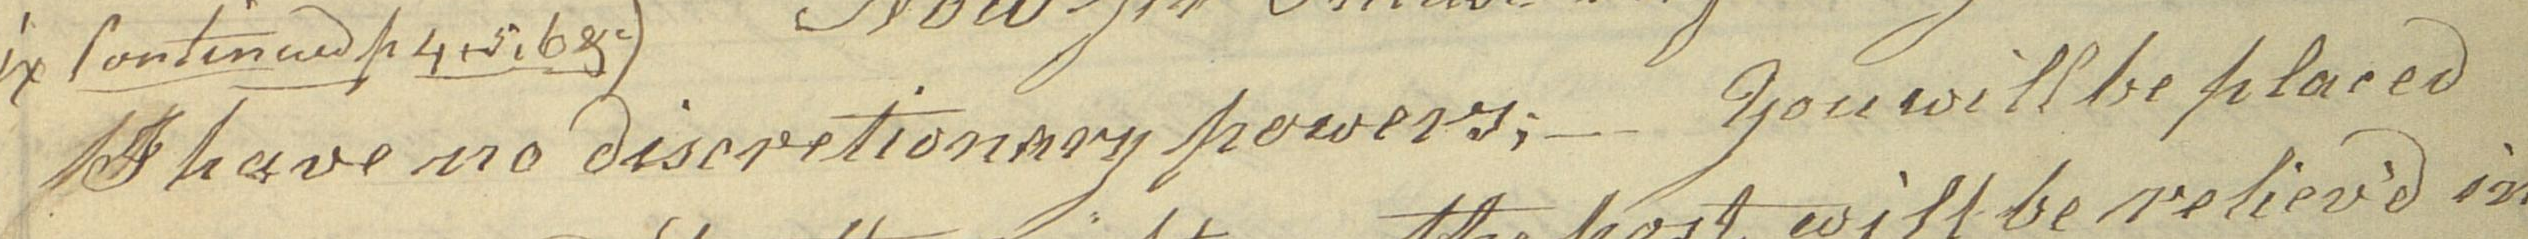I have no discretionary powers; You will be placed
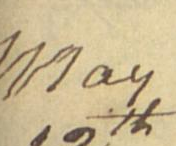May
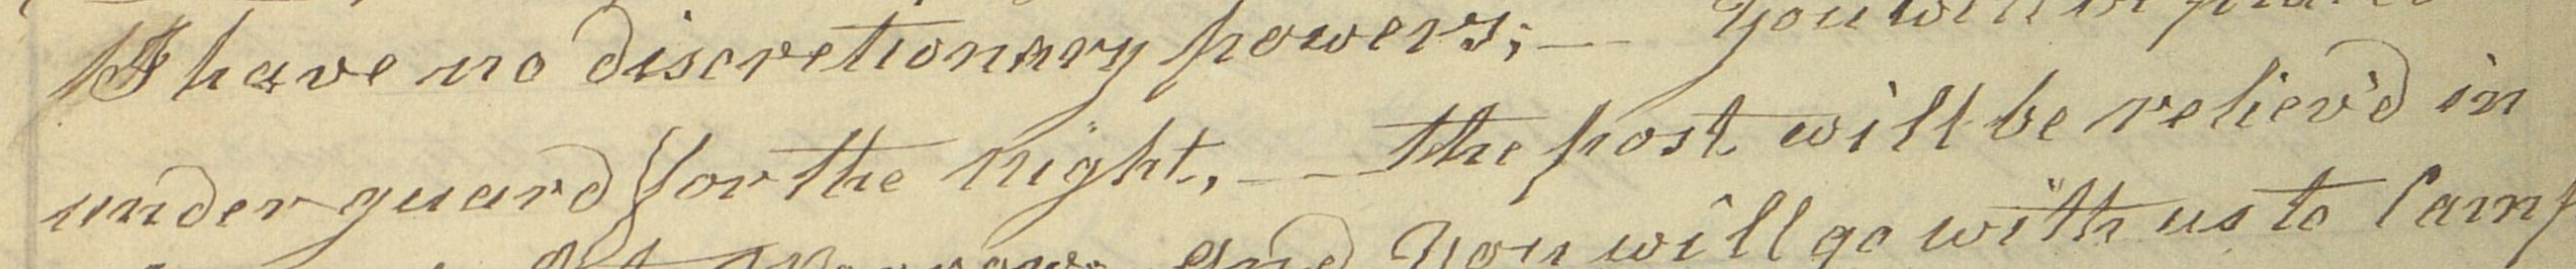under guard for the night, the post will be reliev'd in
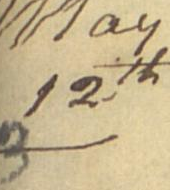12^th
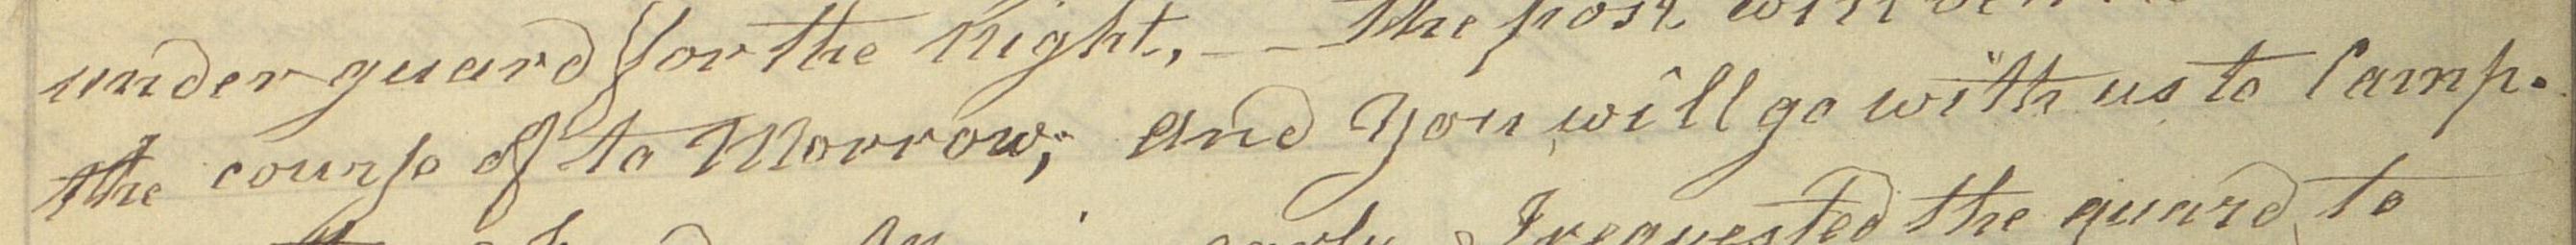the course of tomorrow, and you will go with us to Camp.
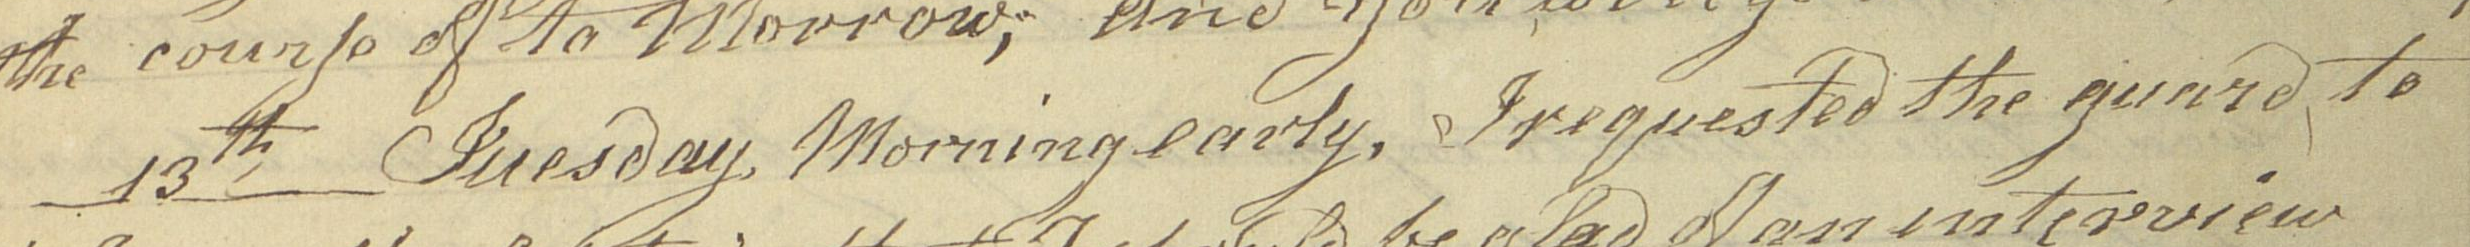13^th Tuesday morning early, I requested the guard to
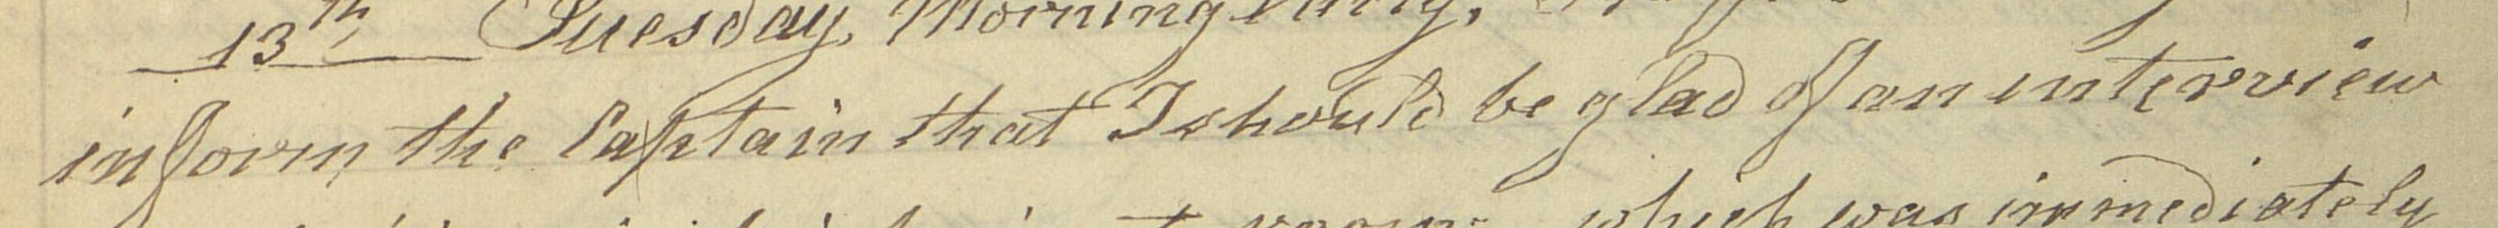inform the Captain that I should be glad of an interview
